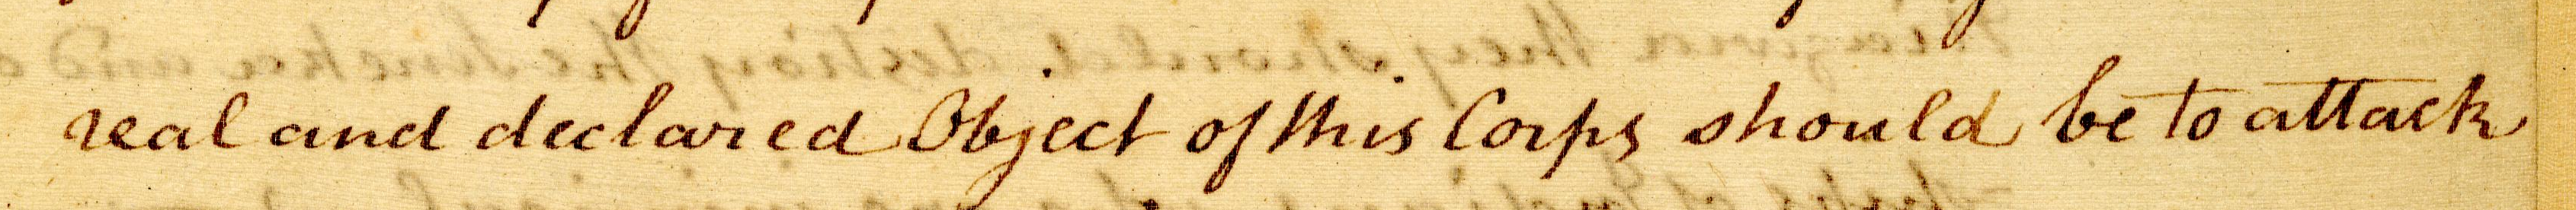real and declared Object of this Corps should be to attack
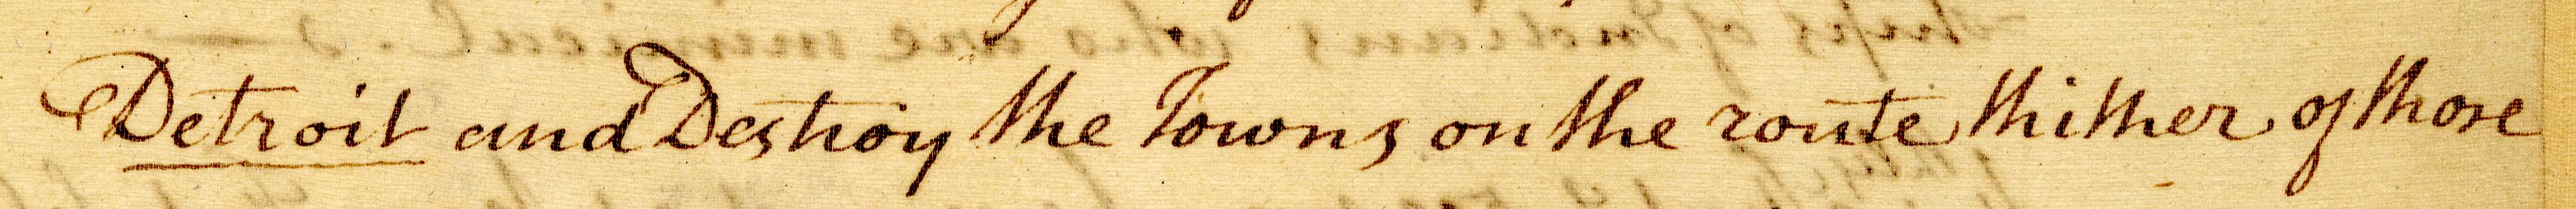Detroit and Destroy the Towns on the route thither of those
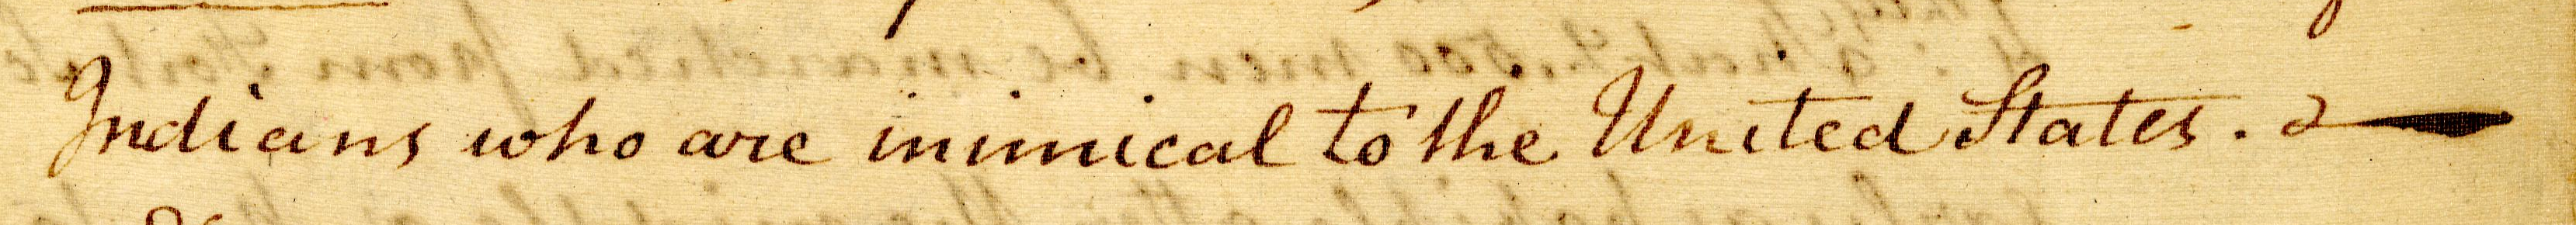Indians who are inimical to the United States.-
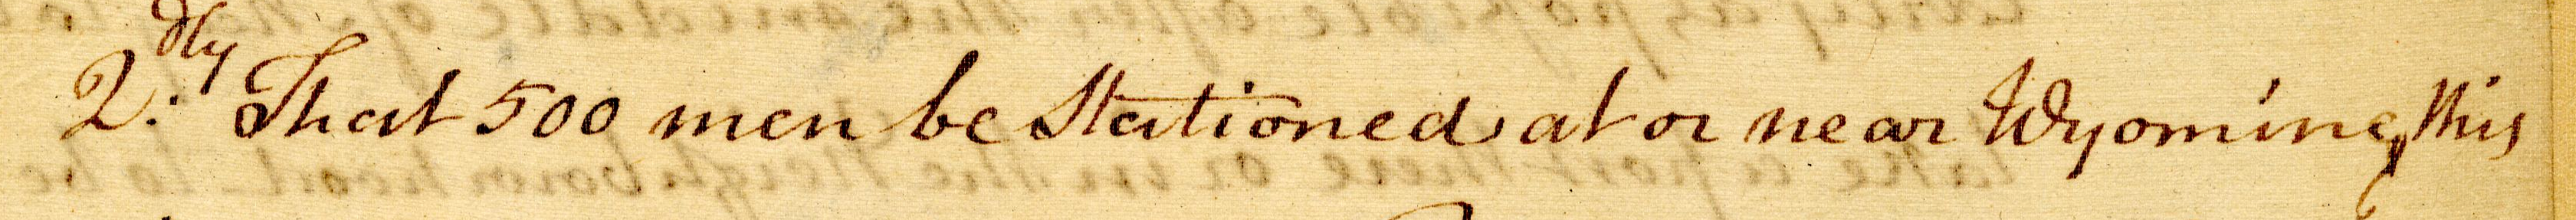2^dly: That 500 men be Stationed at or near Wyoming this
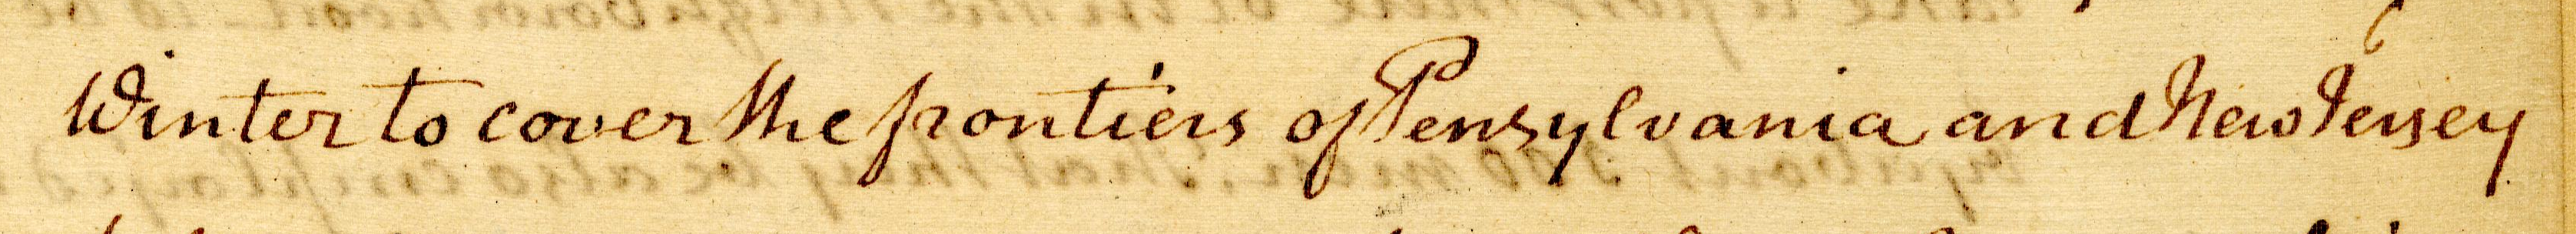Winter to cover the frontiers Pennsylvania and New Jersey
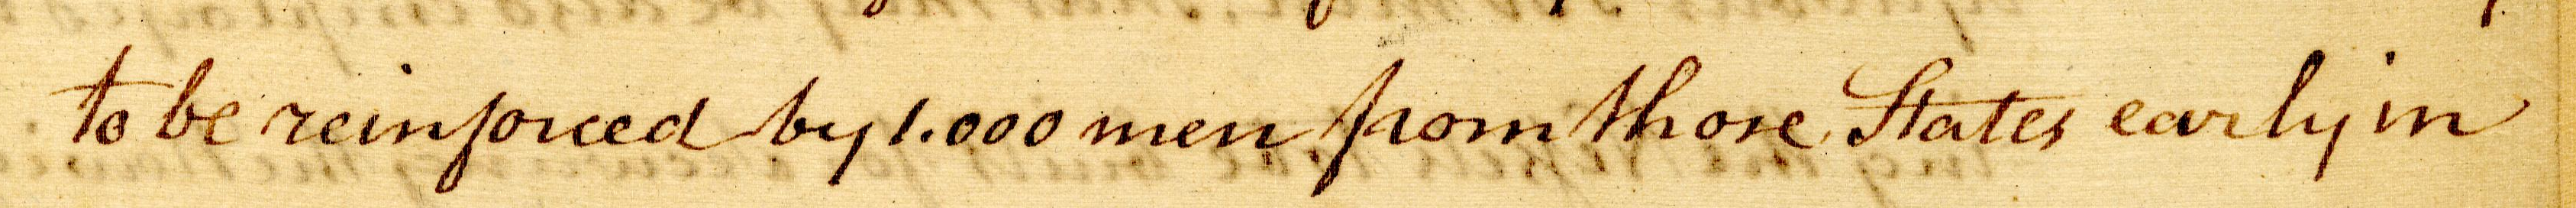to be reinforced by 1.000 men from those States early in
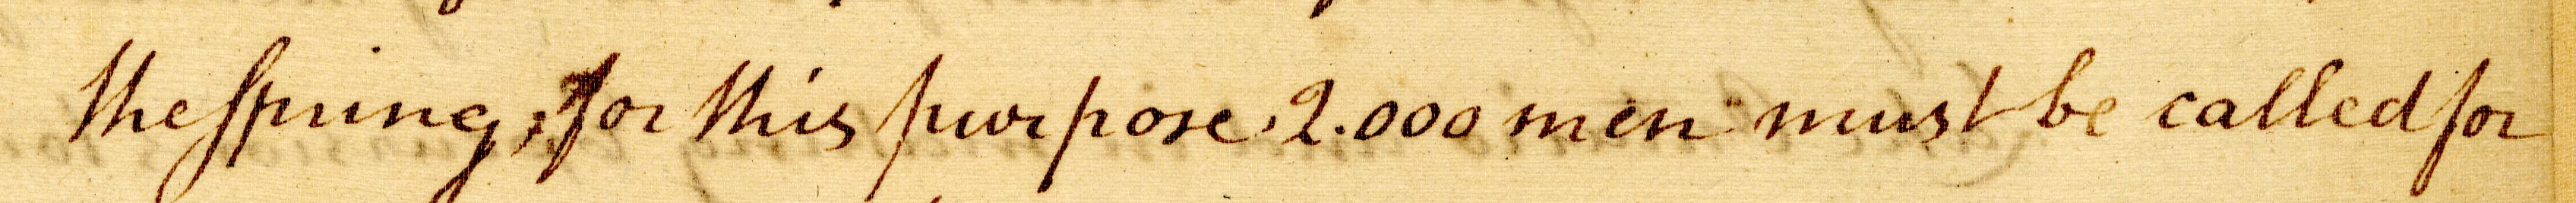the Spring, for this purpose, 2.000 men must be called for
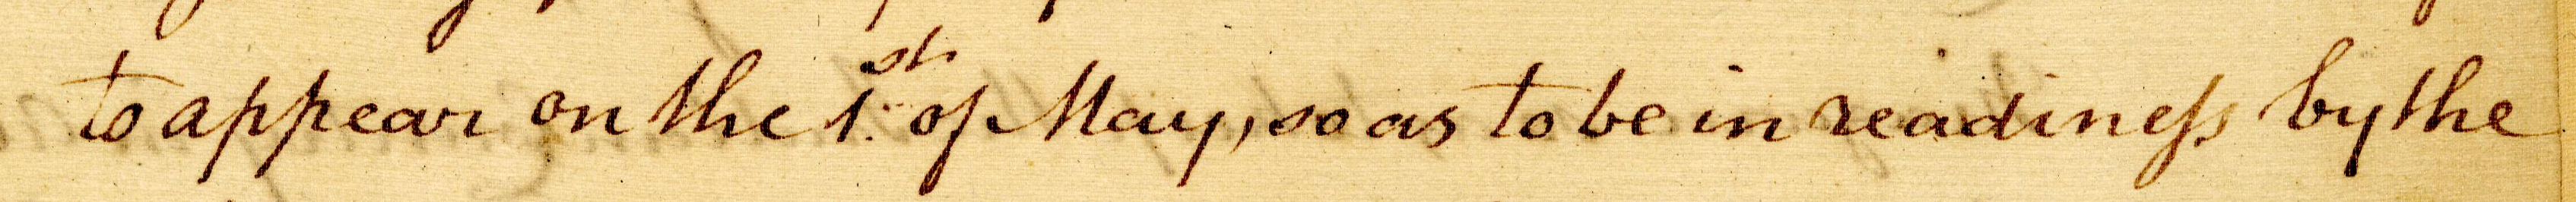to appear on the 1^st: of May, so as to be in readiness by the
